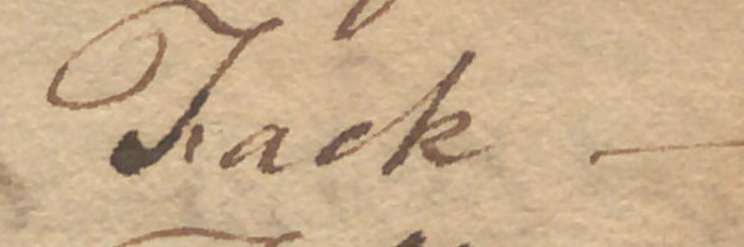Fack
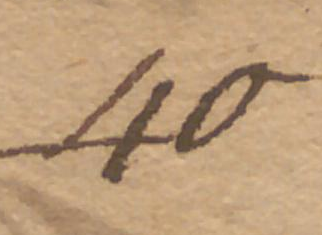40
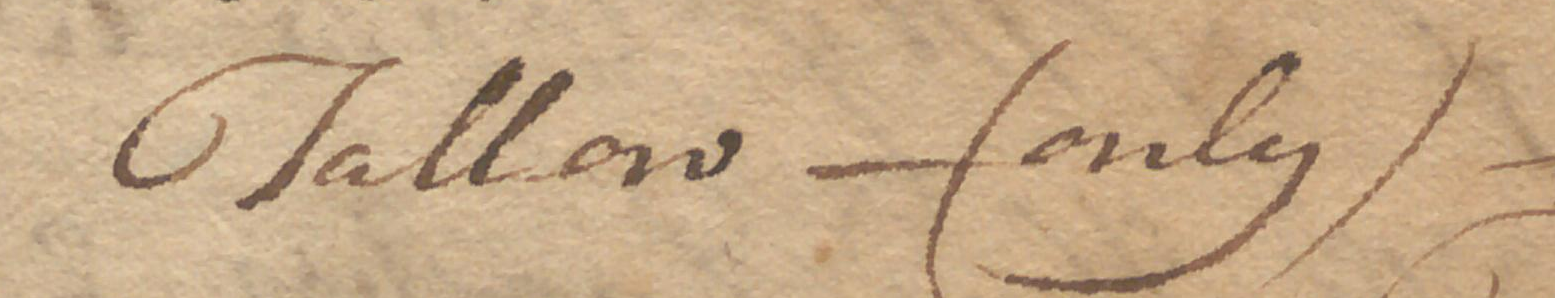Tallow-(only)
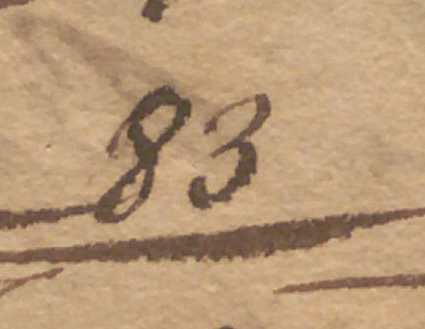83
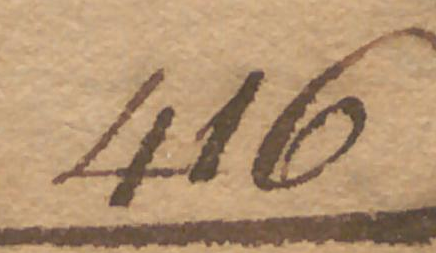416
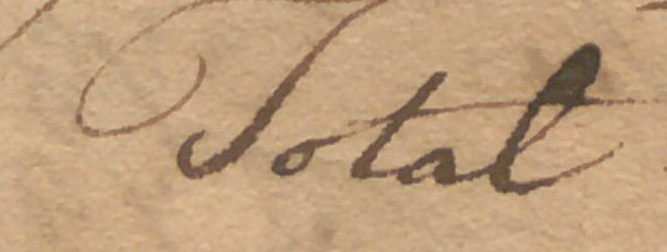Total
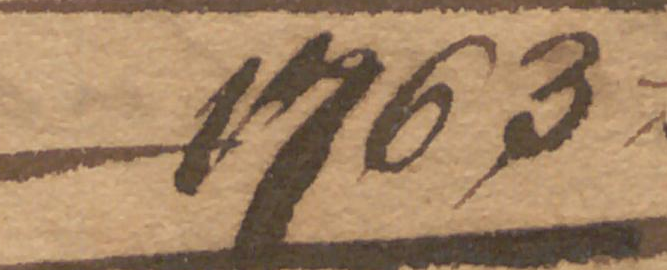1763
